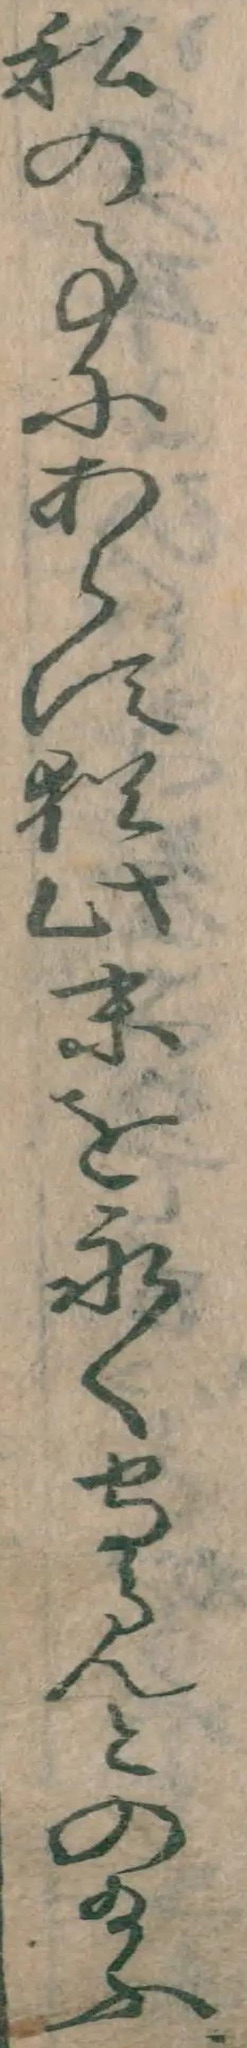私の事にあらす猶此末を永く守らんとの給ふ

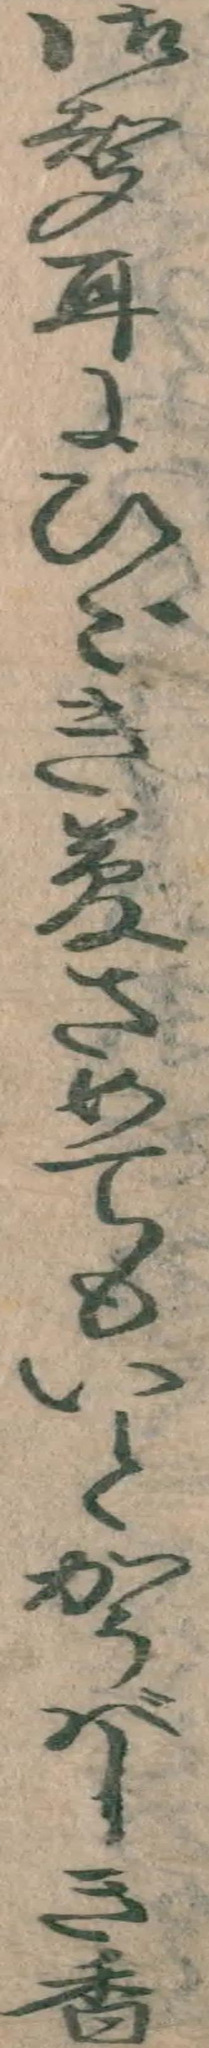御声耳にひゞき夢さめてもいとかうばしき香
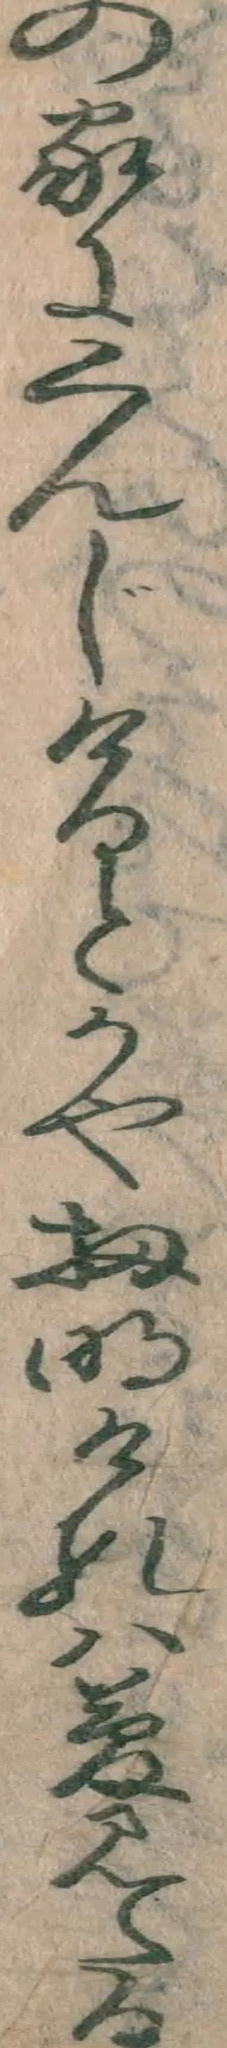の家にくんじけるとかや扨明ければ夢見たる
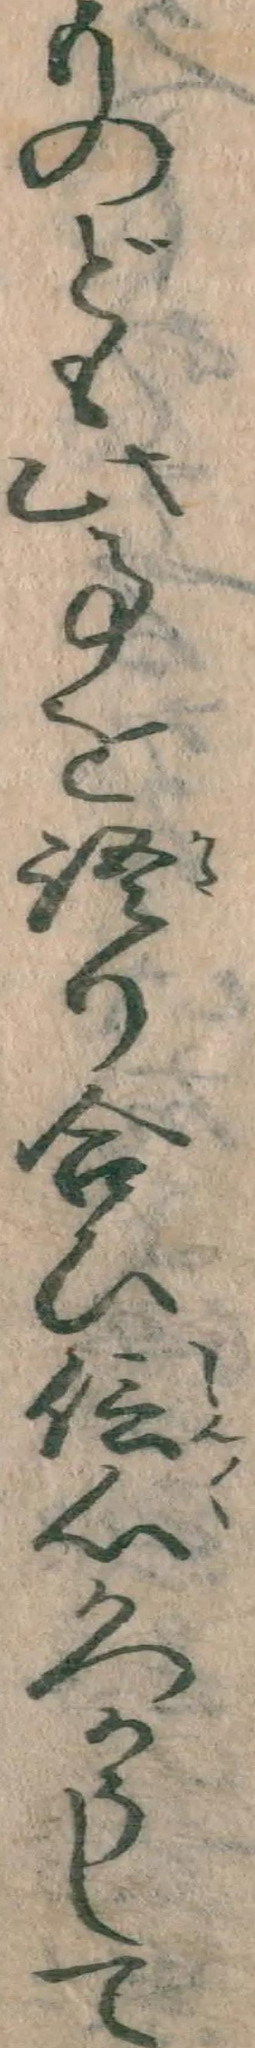ものども此事を語り合ひ信心かつかうして
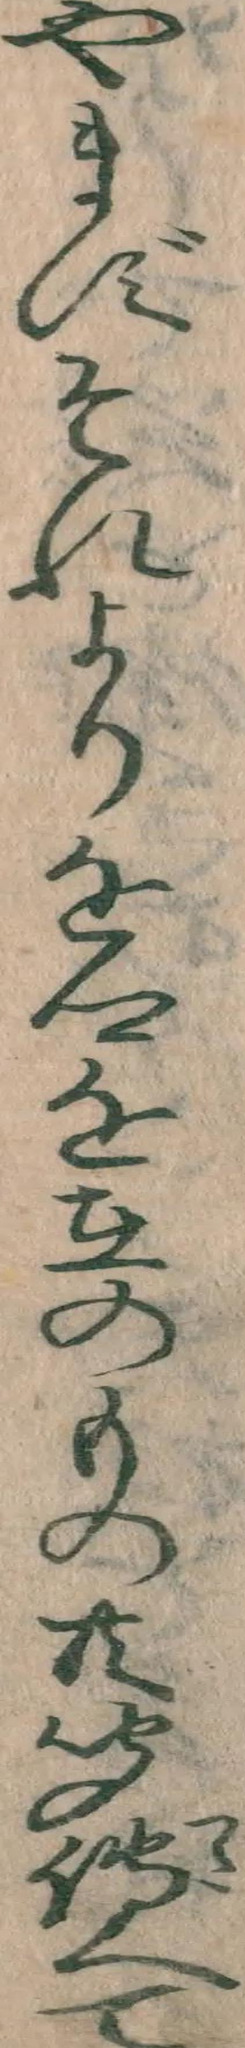やまずそれより近郷近在のもの共聞伝へて
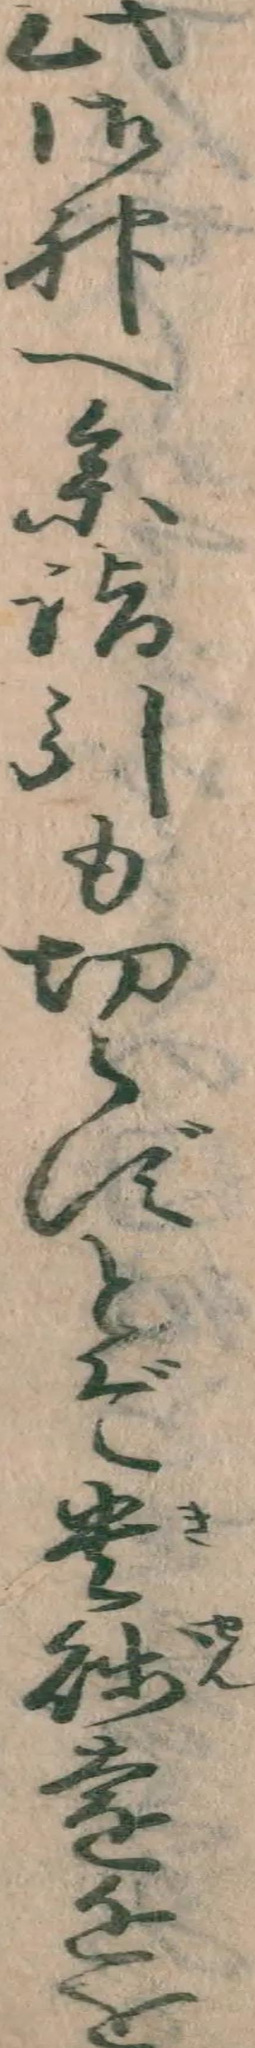此御神へ参詣引も切らずとぞ貴賎遠近を
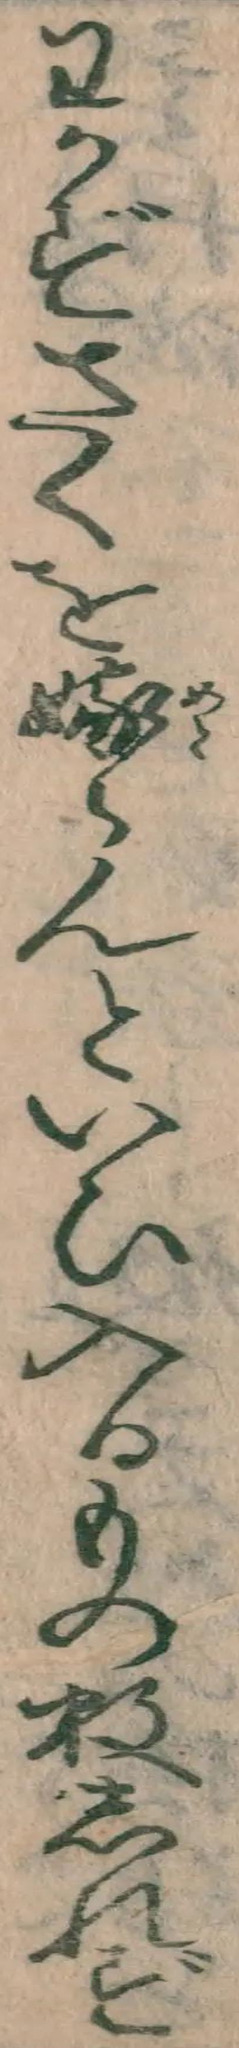わかずさくを嫁らんといひ入るもの数しれず
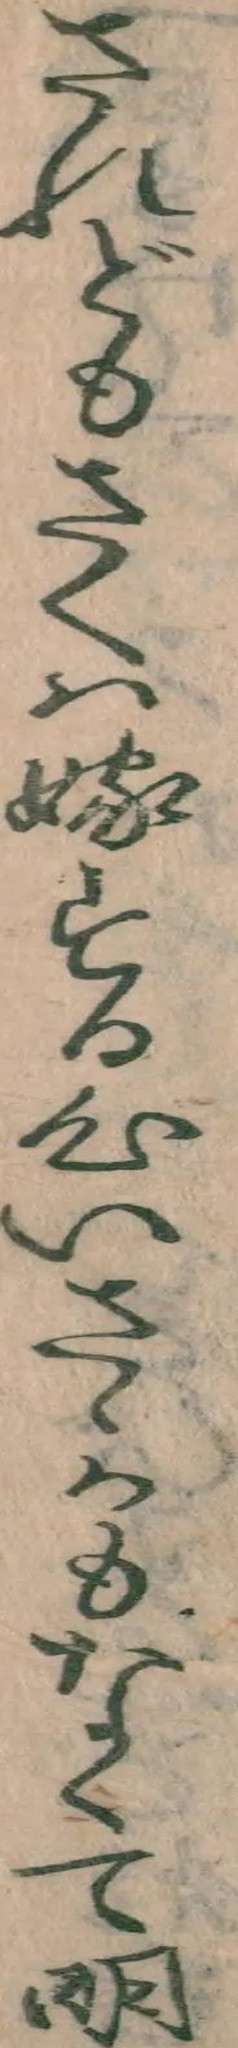されどもさくは嫁する心いさゝかもなくて明
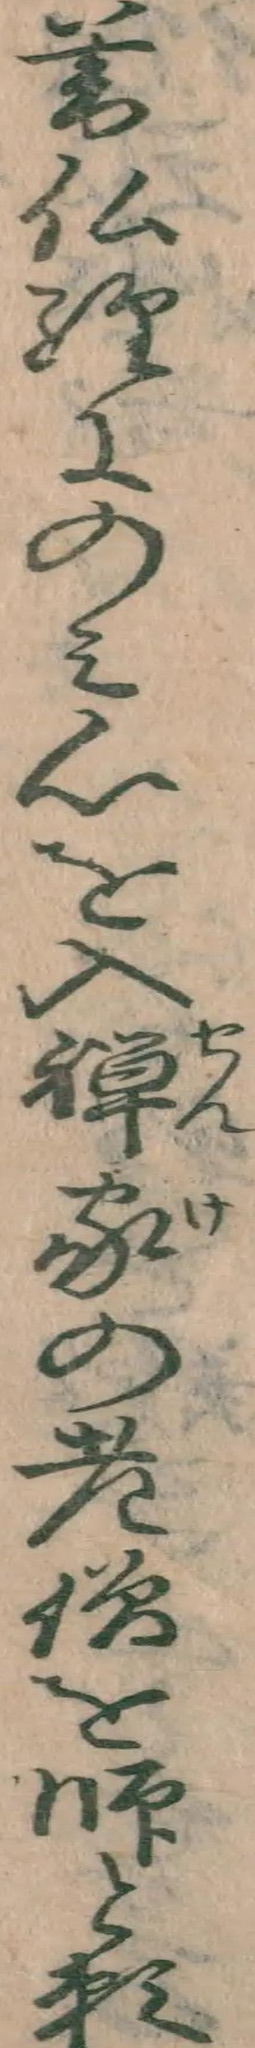暮仏経にのみ心を入禅家の老僧を師と頼
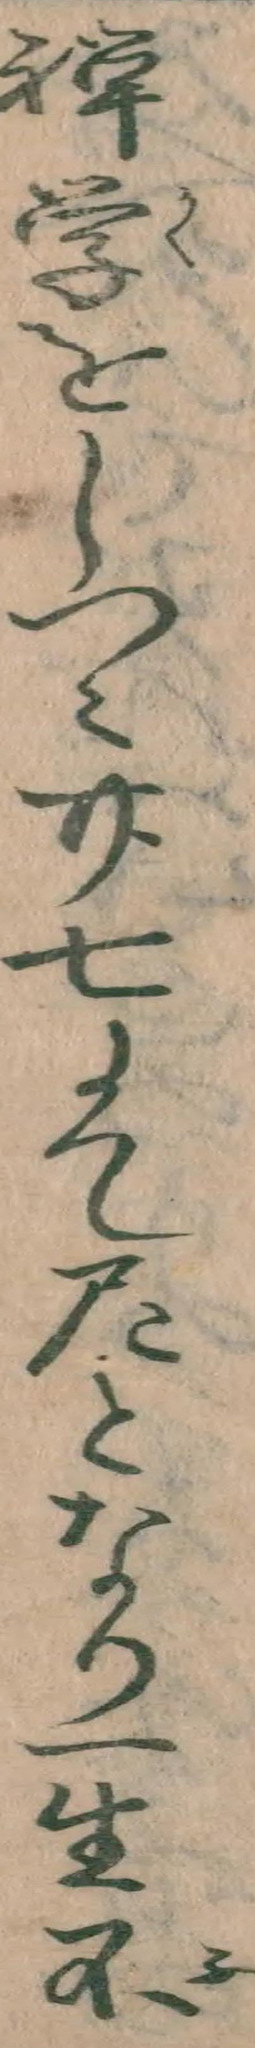禅学をしつゝ廿七にて尼となり一生不
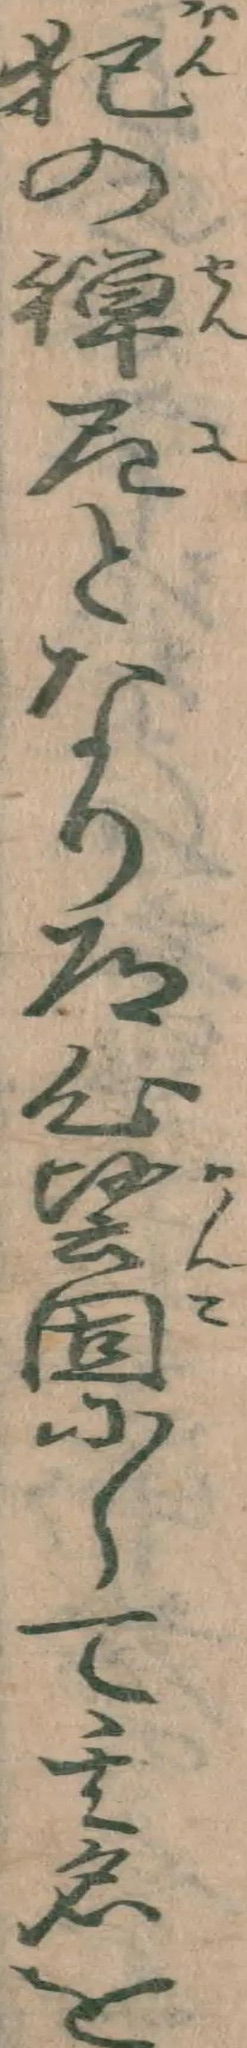犯の禅尼となり道心堅固にして其名を
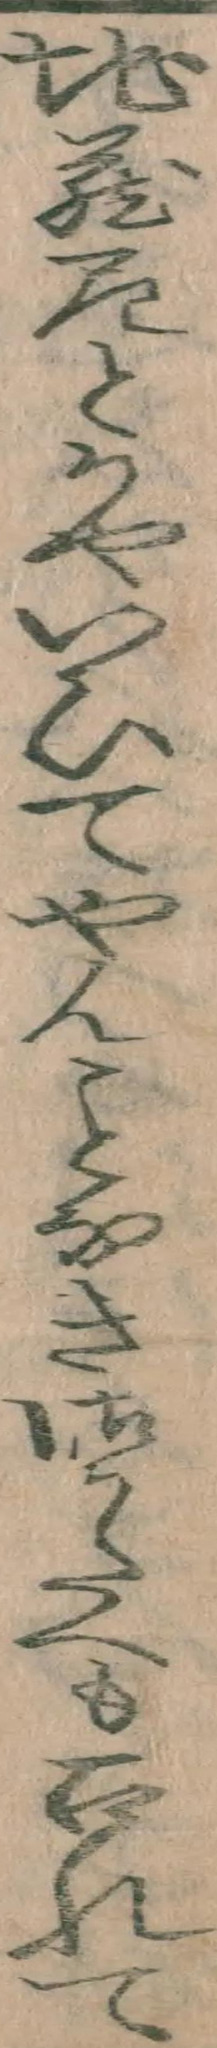地蔵尼とかやいひてやんことなき御かたへも召れて
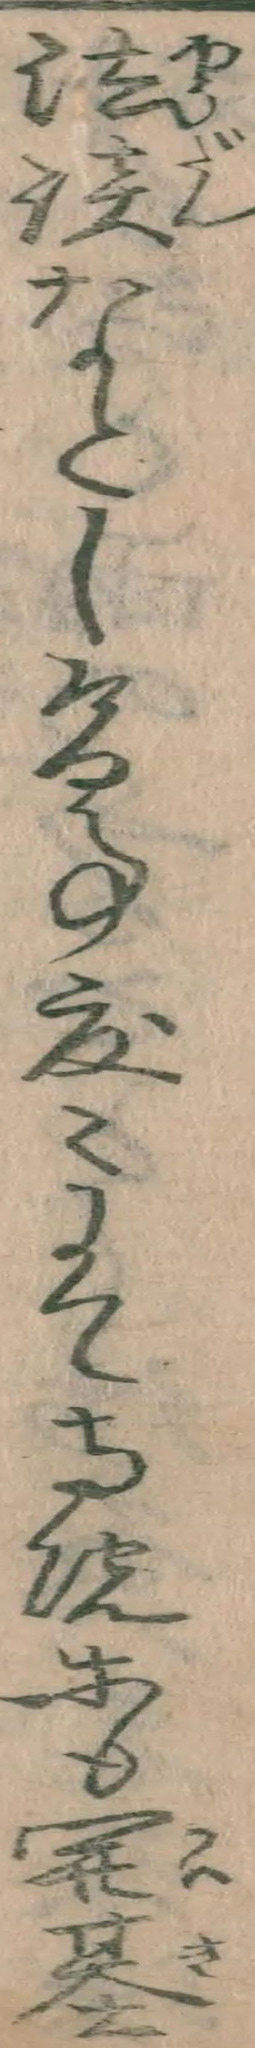法談なとしける事度々にて寺院等も開基
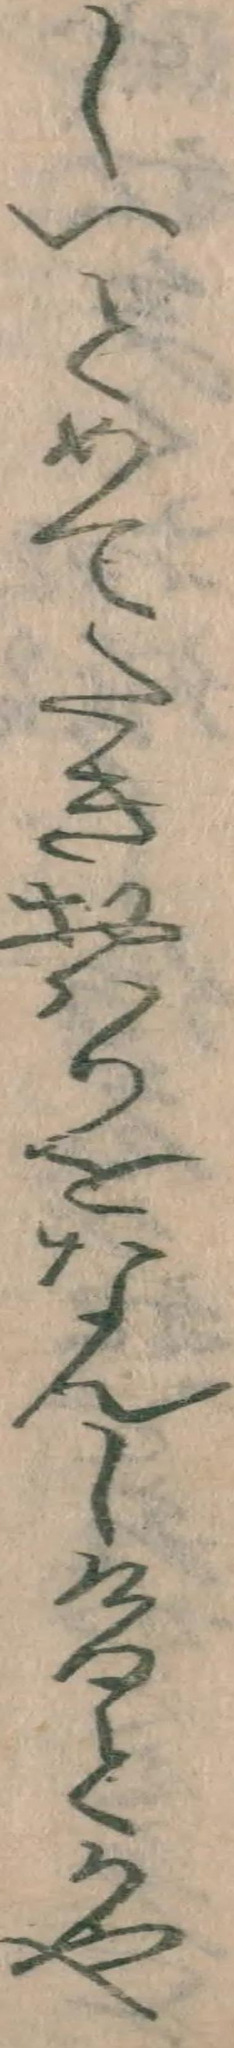しいとめてたきおはりをなんしけるとかや
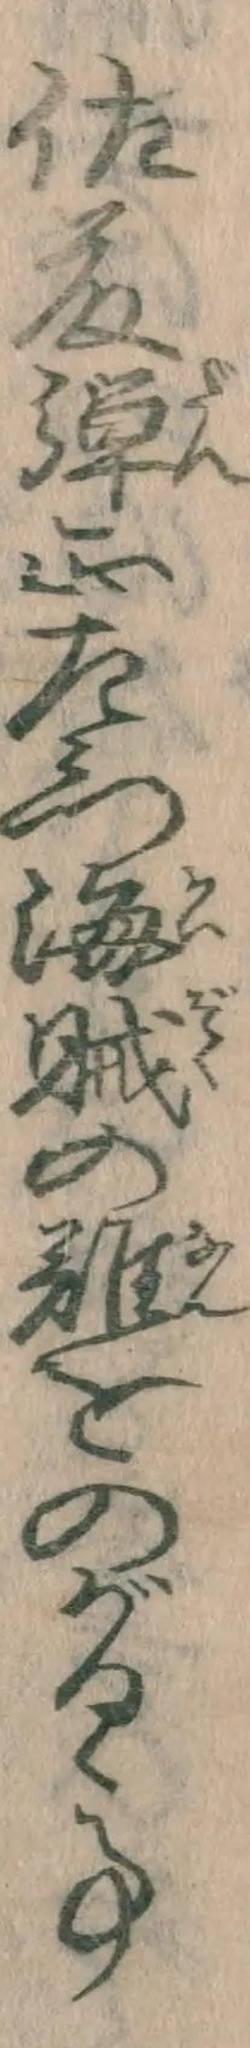佐藤弾正左衛門海賊の難をのがるゝ事
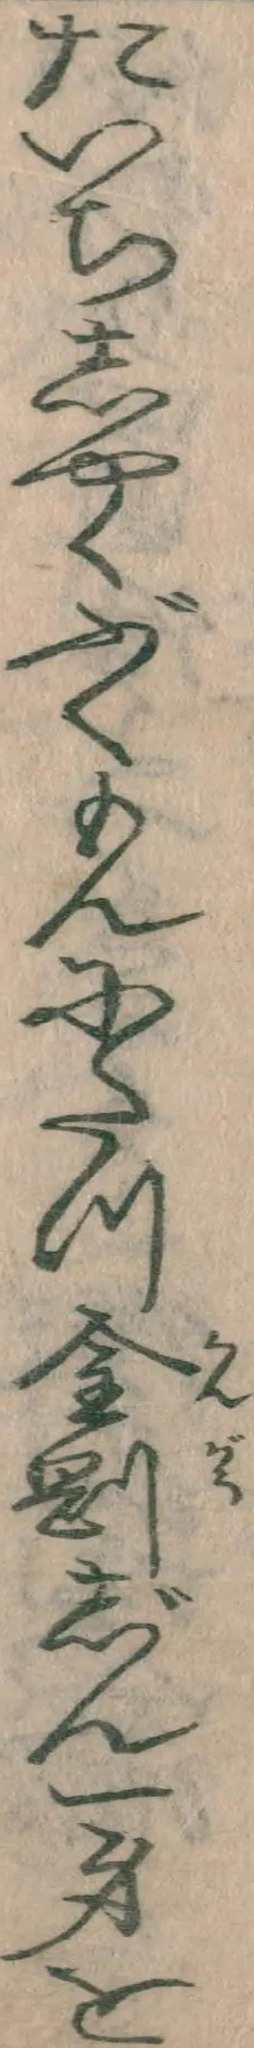たいちしやくぶくもんにたつ金剛じん一身を
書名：怪談御伽童 5巻. [1]
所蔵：国立国会図書館 National Diet Library, JAPAN
